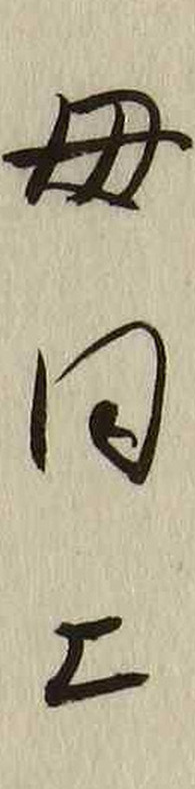母同上
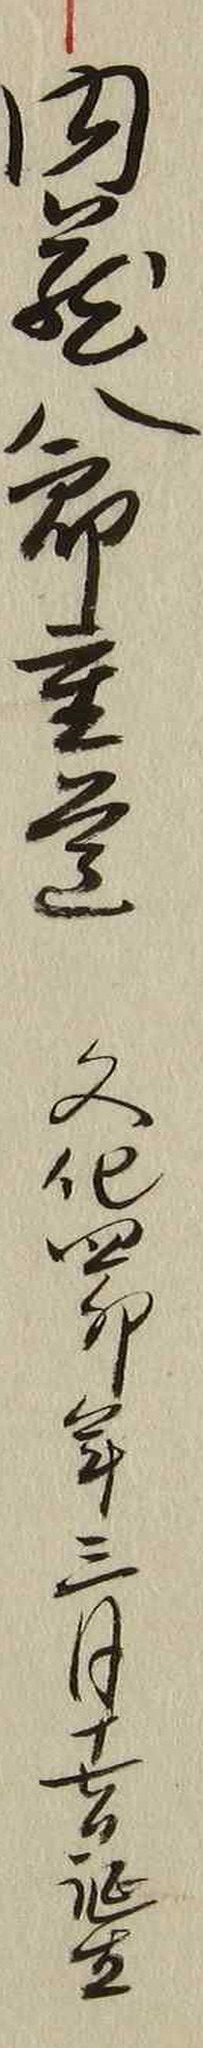内蔵八郎重道文化四卯年三月十七日誕生
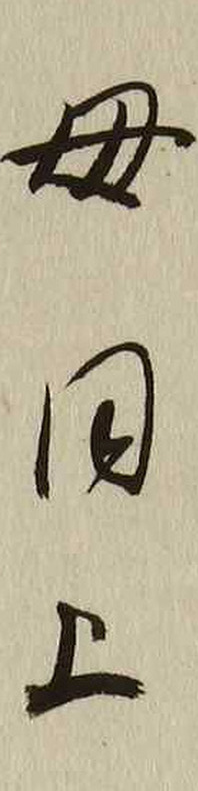母同上
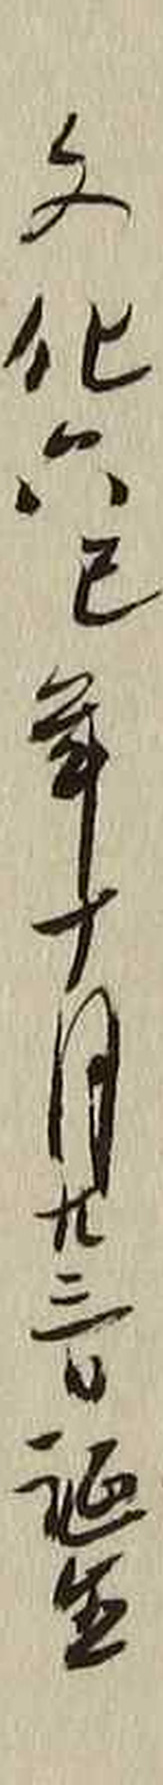女文化六巳年十月廿三日誕生
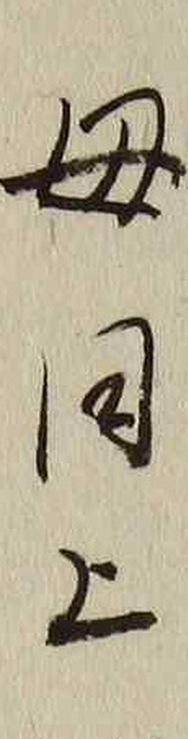母同上
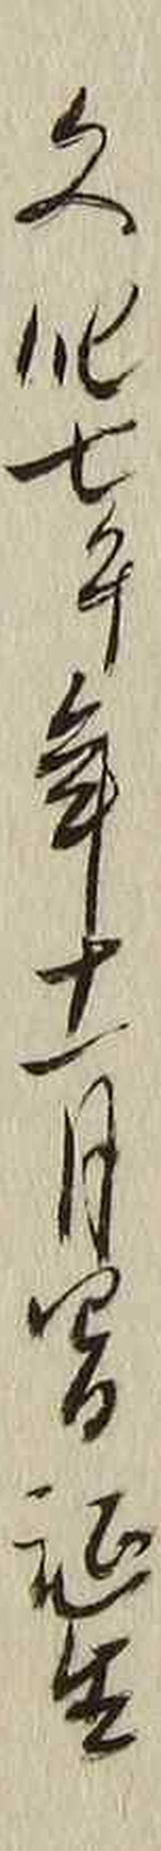女文化七午年十一月四日誕生
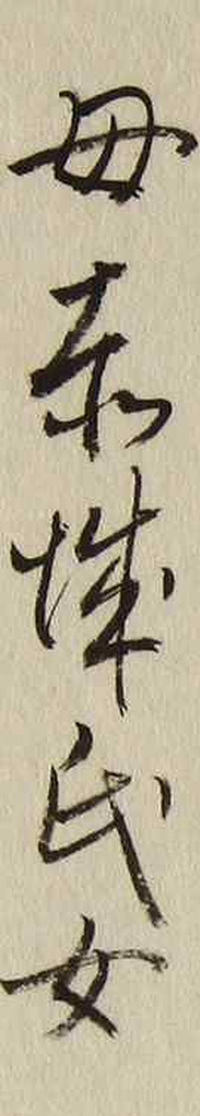母赤城氏女
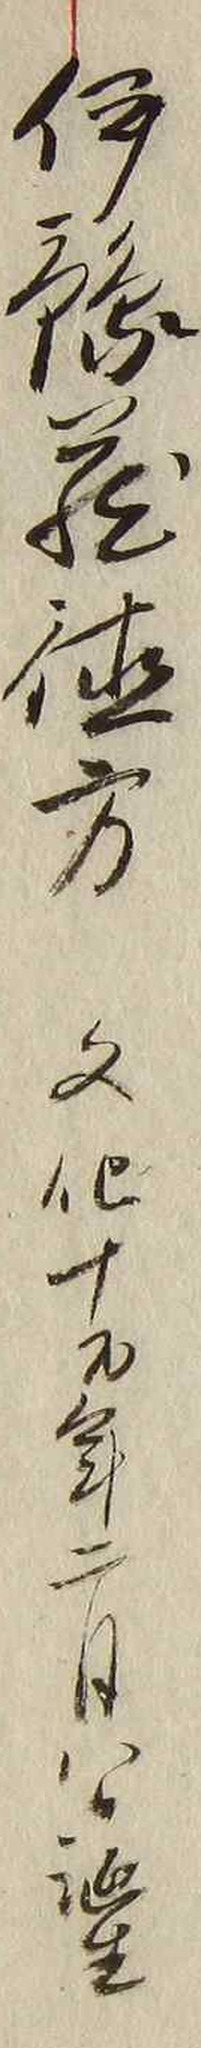伊予蔵徳方文化十酉年二月八日誕生

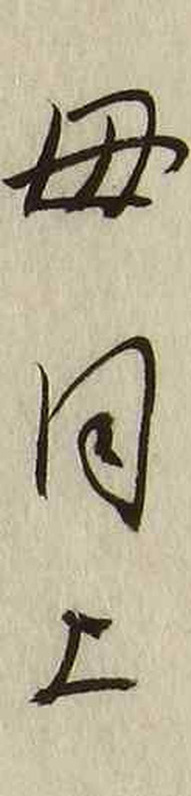母同上
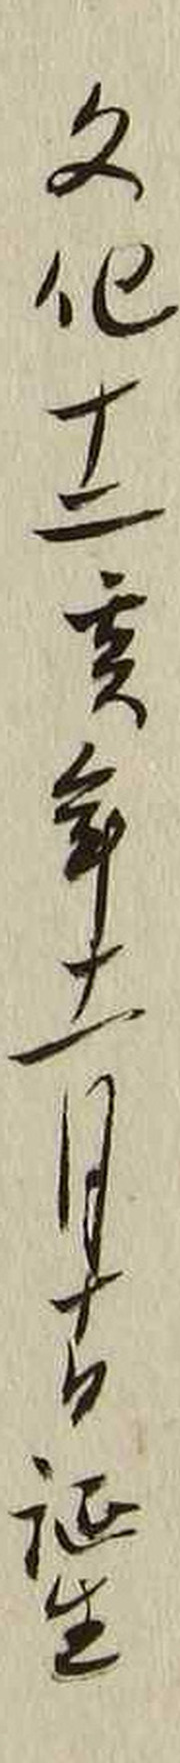女文化十二亥年十一月十日誕生
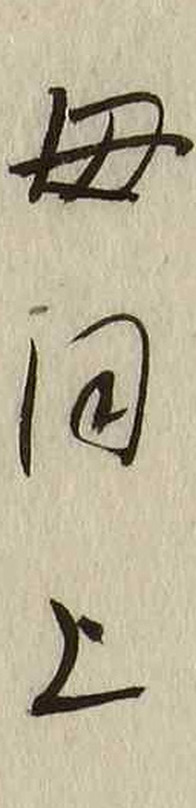母同上
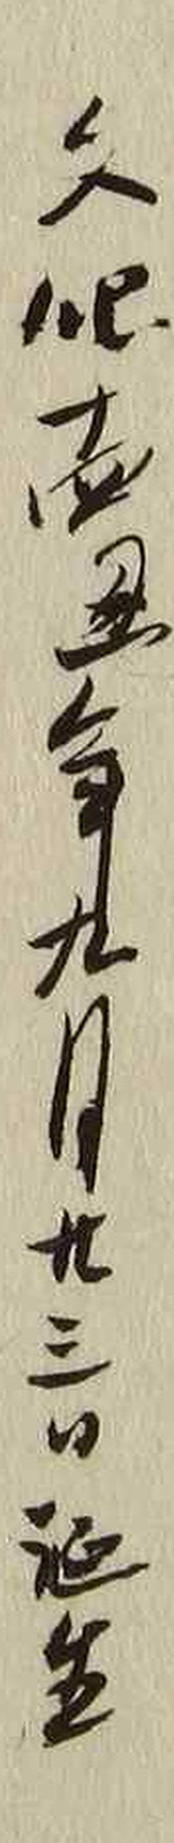女文化十四丑年九月廿三日誕生
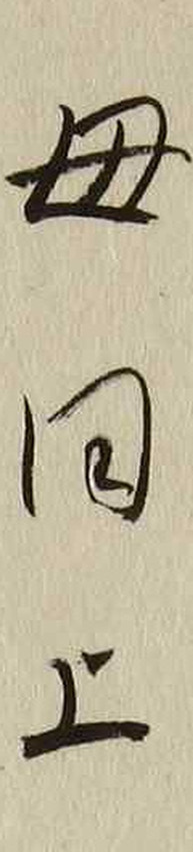母同上
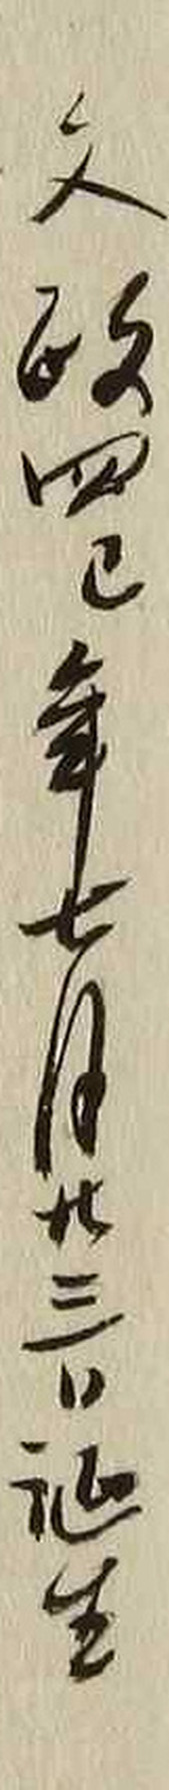女文政四巳年七月廿三日誕生
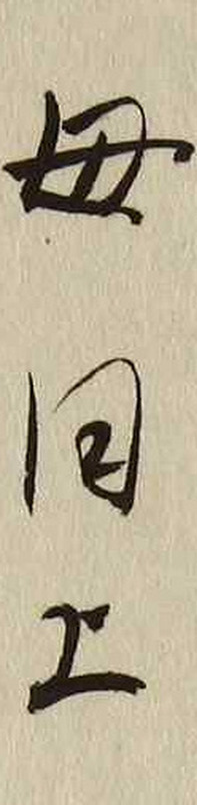母同上

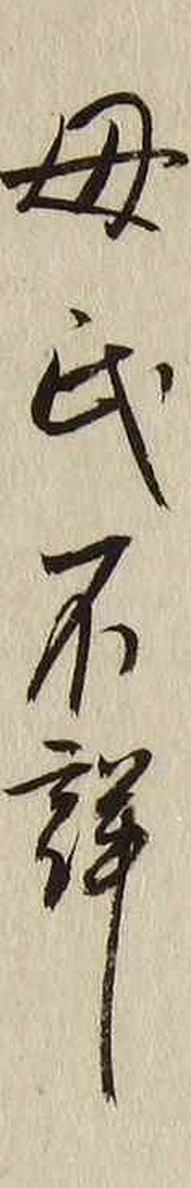母氏不詳
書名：諸士系譜　巻之352　す之部2
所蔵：会津若松市立会津図書館
